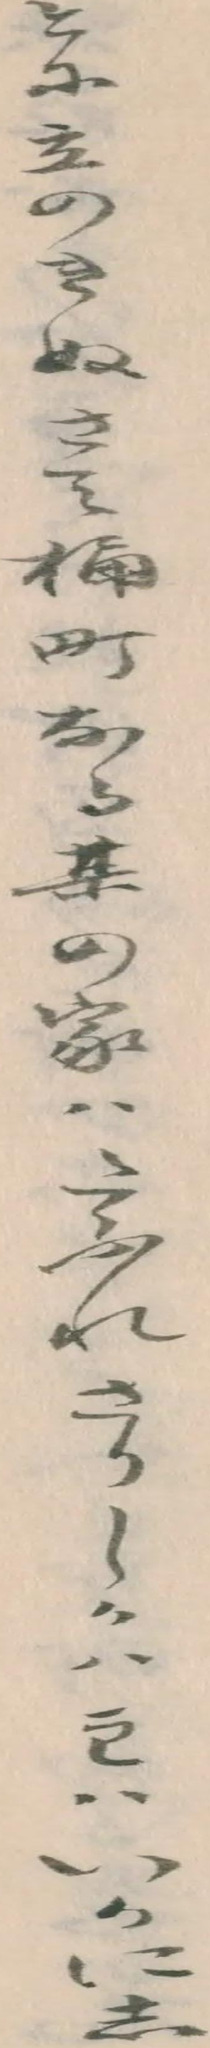とに立のきぬさて桶町なる某の家はたふれさりしかは主はいかにし
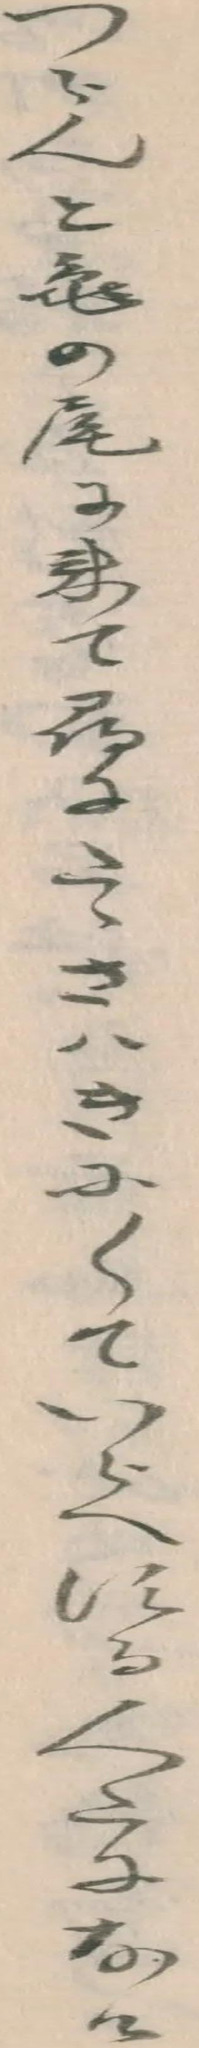つらんと亀の尾に来て尋にたゝさはきにくていらへする人たになけ
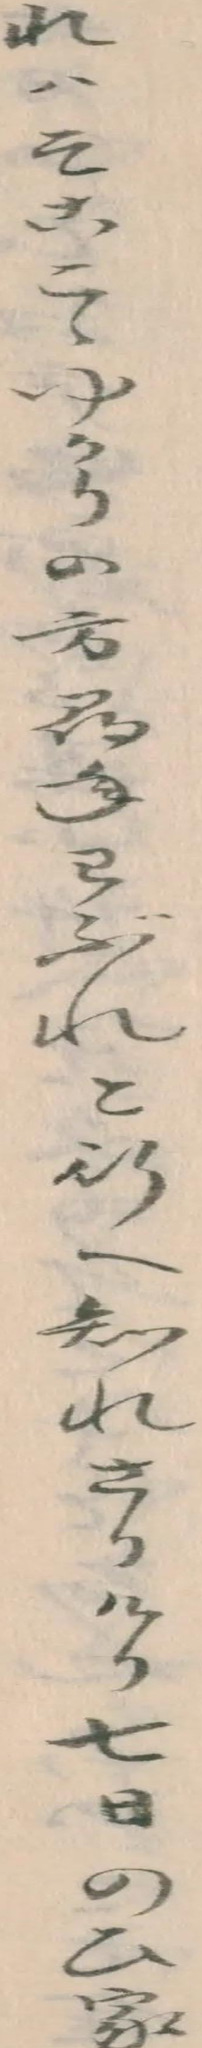れはそここゝゆかりの方尋てわぶれと行へ知れさりけり七日のひ家
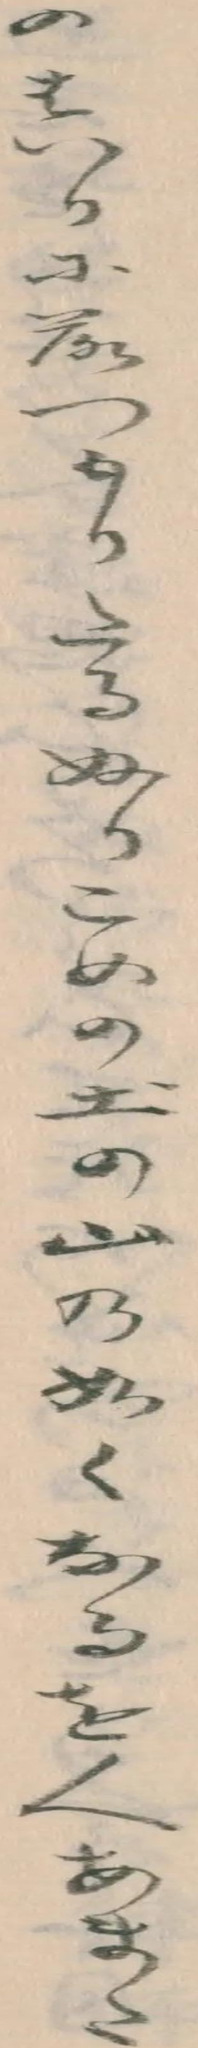のはいりに落つもりたるぬりこめの土の山の如くなるを人あまた
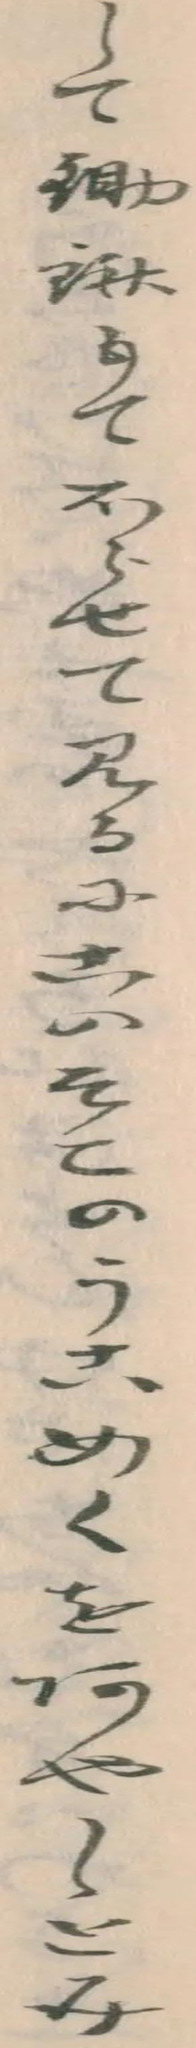して鋤鍬もてほらせて見るにこのそこのうこめくをあやしとみ
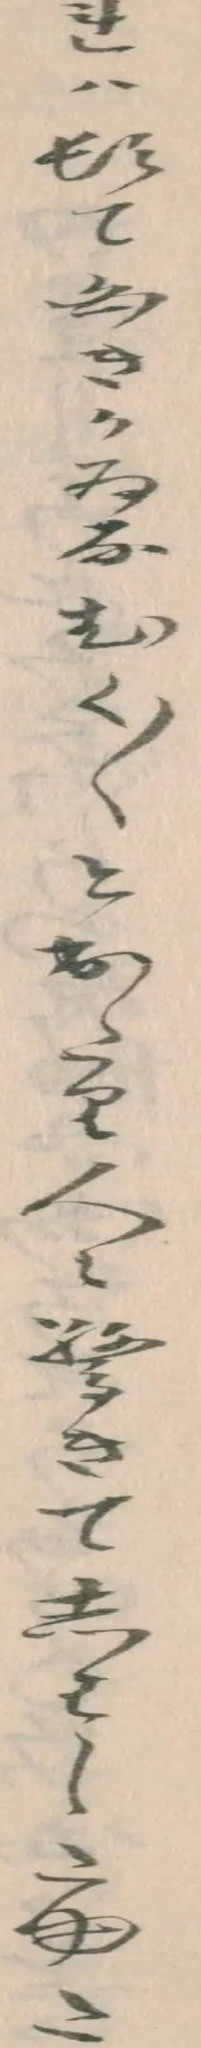れは頓て白きかゐなむく〳〵と出たり人々驚きてしはしたゆた
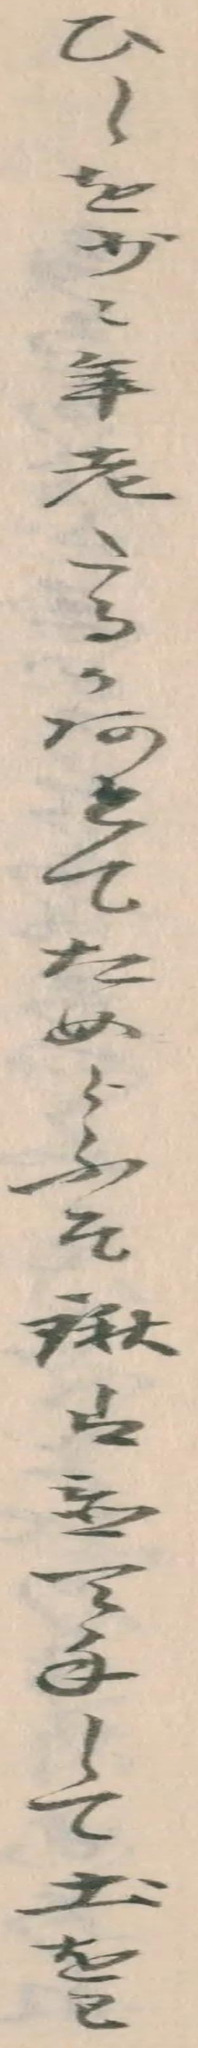ひしを少々年老たるかあとてためらふそ鍬は置て手して土をわ
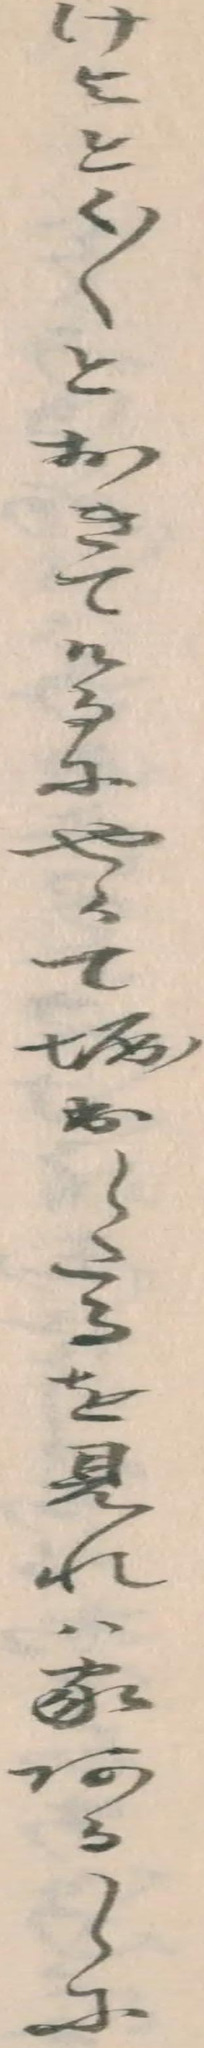けよとく〳〵とおきてけるにやかて堀出したるを見れは家あるしに
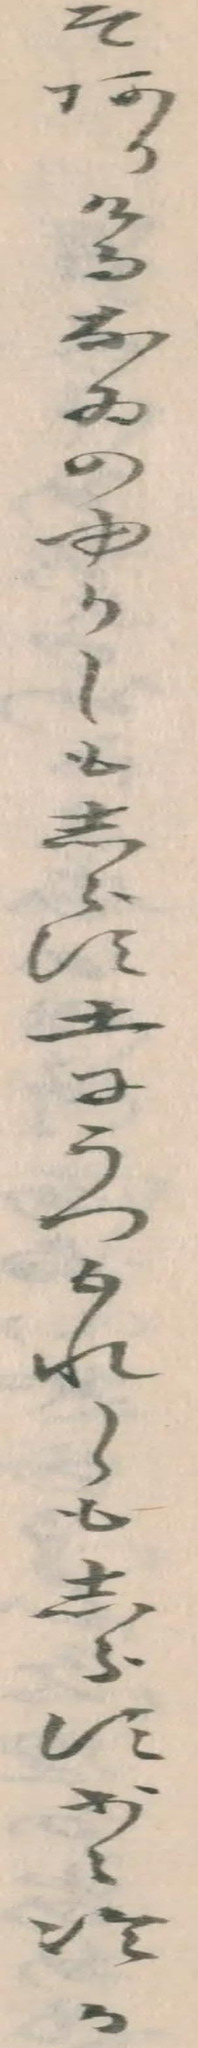そありけるなゐのゆりしもしらす土にうつもれしもしらす少々冷か
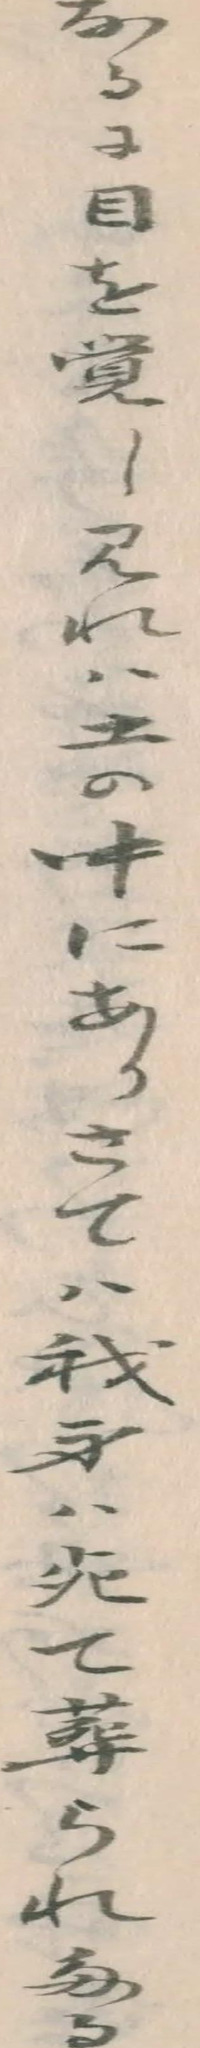なるに目を覚し見れは土の中にありさては我身は死て葬られたる
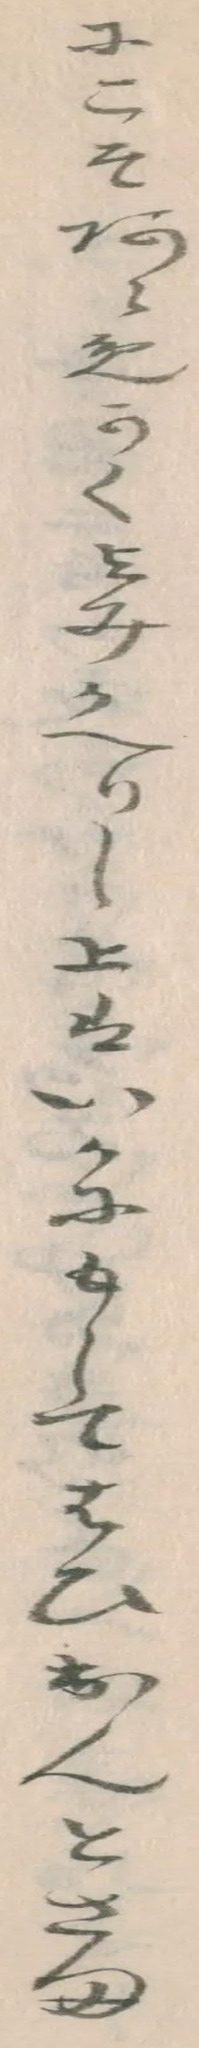にこそあらめかくよみかへりし上はいかにもしてはひ出んとさま
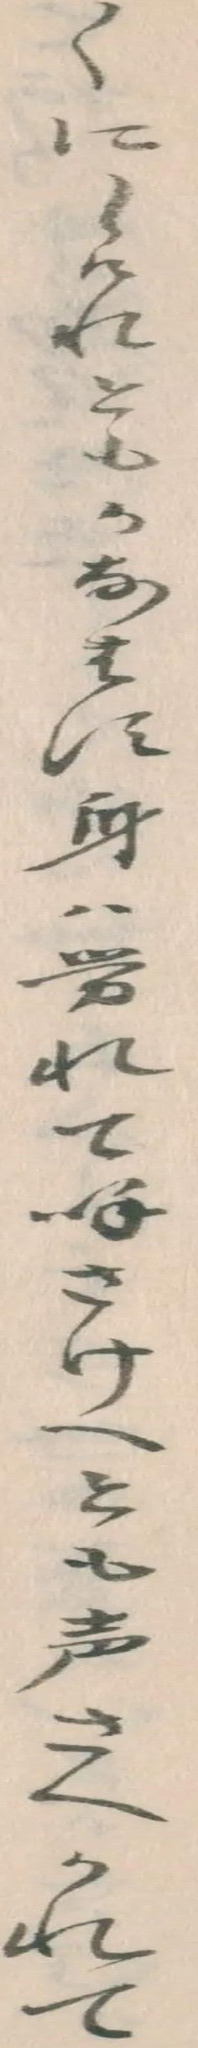〳〵にしけれともかなはす身は労れて呼さけへとも声さへかれて
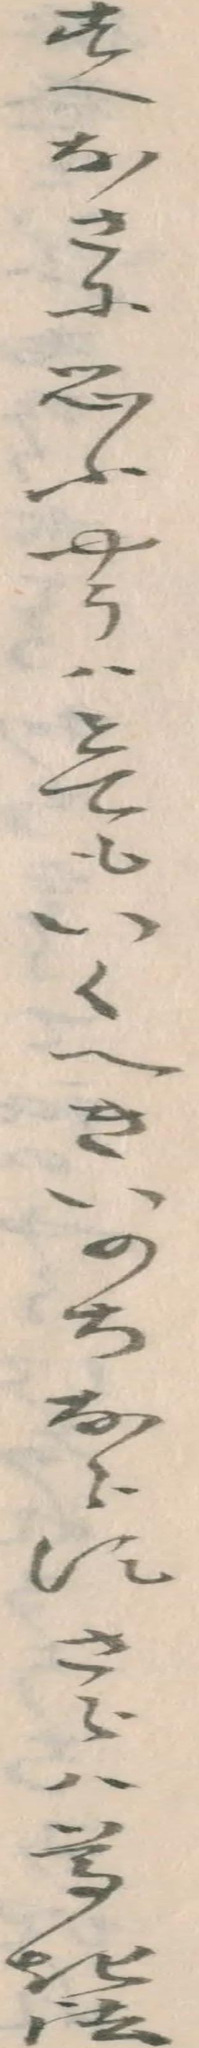すへなさに思ふやうはとてもいくへきいのちならすさらは尊き法
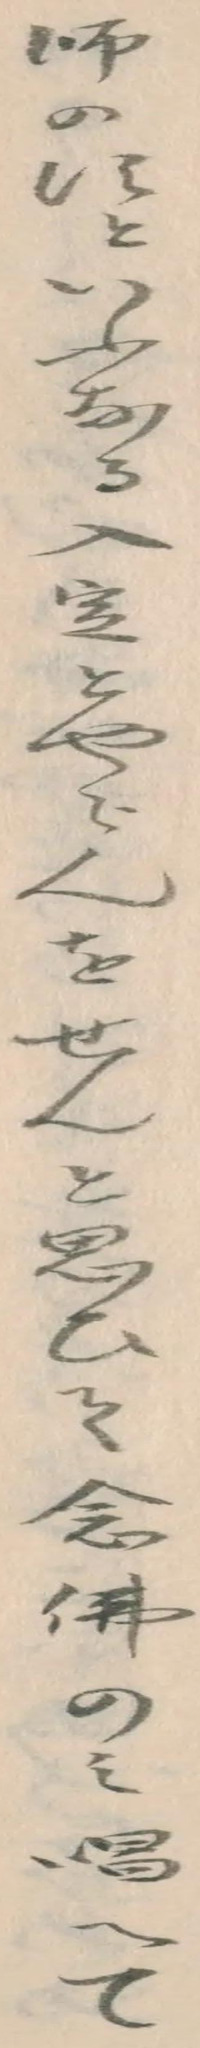師のすといふなる入定とやらんをせんと思ひて念仏のみ唱へて

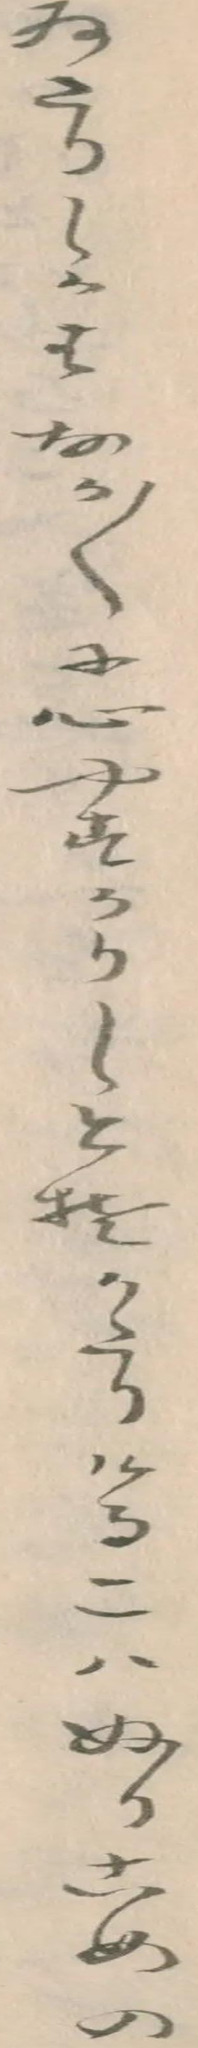ゐたりしかはなか〳〵に心やすかりしとそかたりけるこはぬりこめの
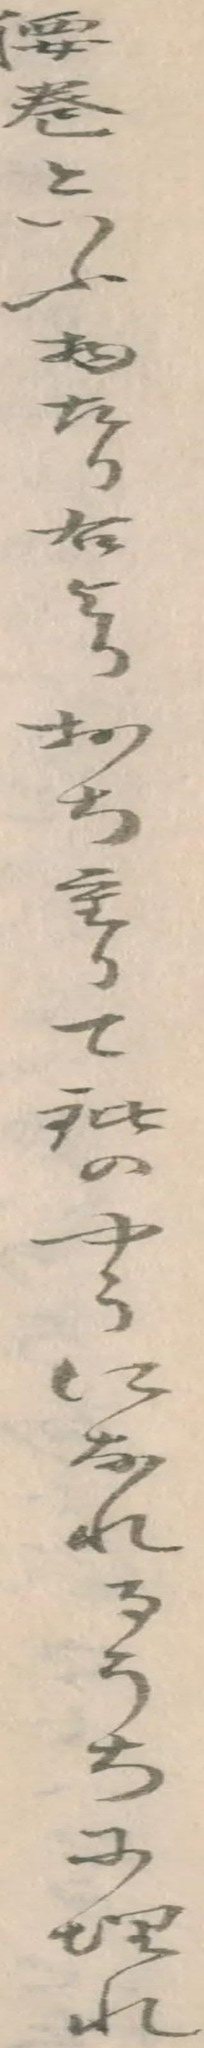腰巻といふ物たり右よりおち重りて庇のやうになれるうちに埋れ
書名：地災撮要. 巻10(地震之部) 上,下
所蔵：国立国会図書館 National Diet Library, JAPAN
